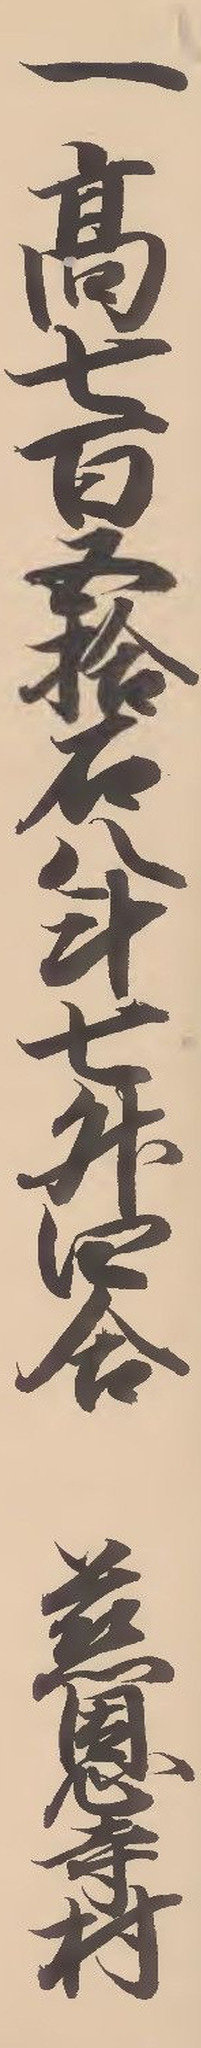一高七百五拾石八斗七升四合慈恩寺村
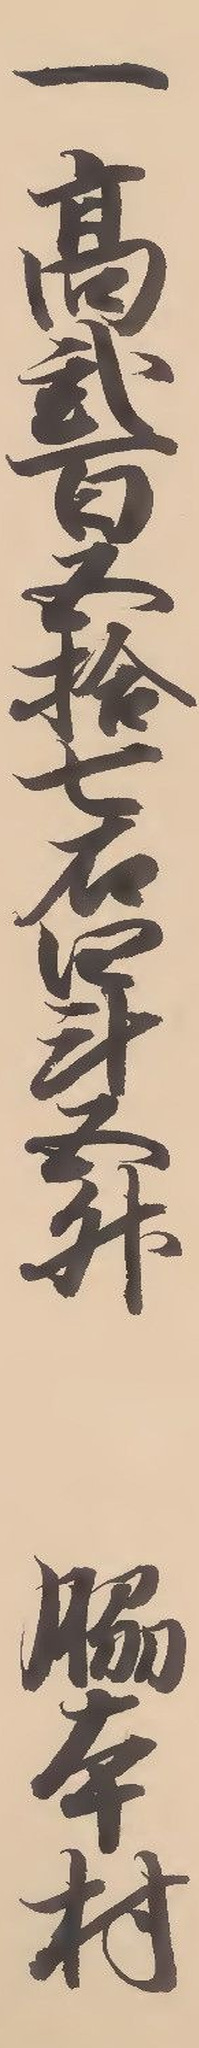一高弐百五拾七石四斗五升脇本村
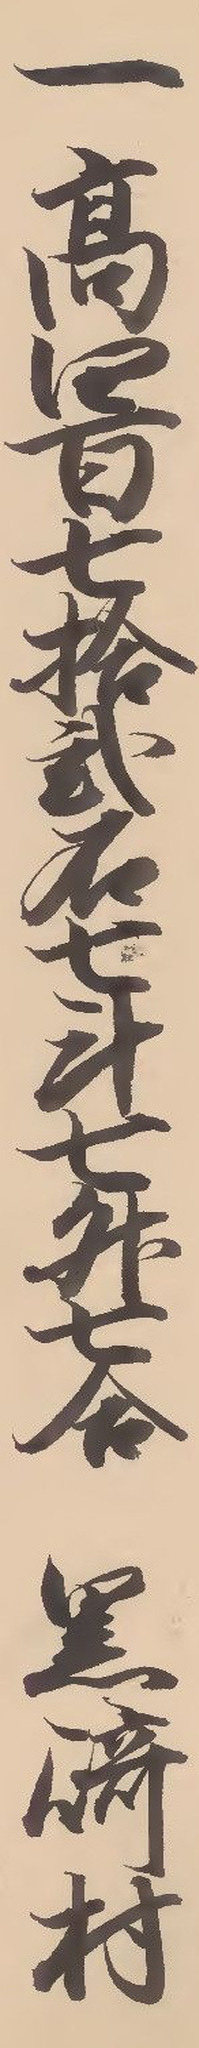一高四百七拾弐石七斗七升七合黒崎村
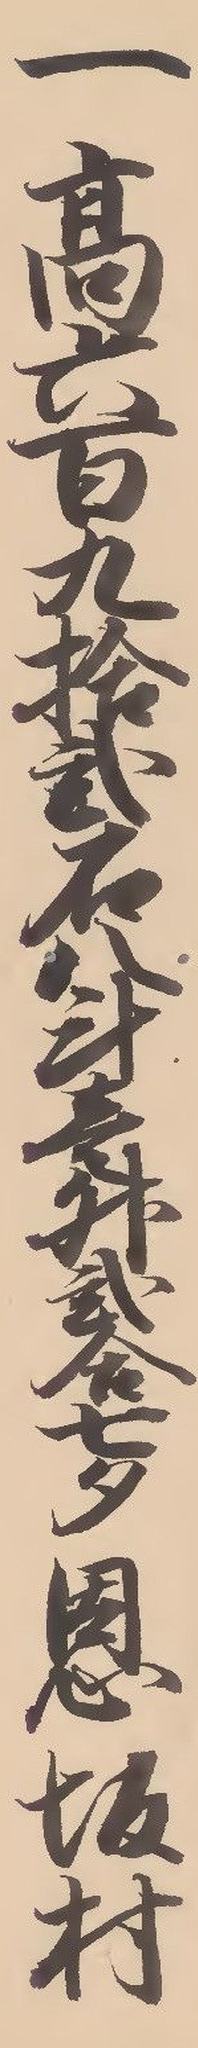一高六百九拾弐石八斗壱升弐合七勺恩坂村

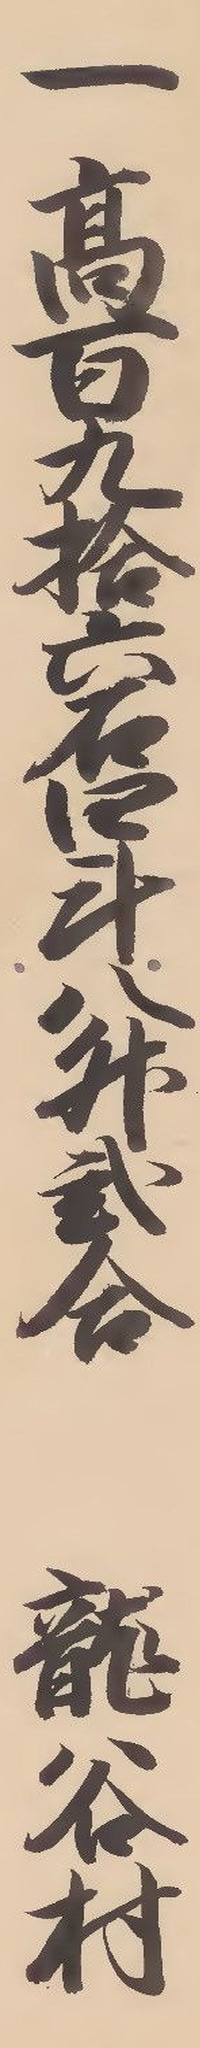一高百九拾六石四斗八升弐合竜谷村
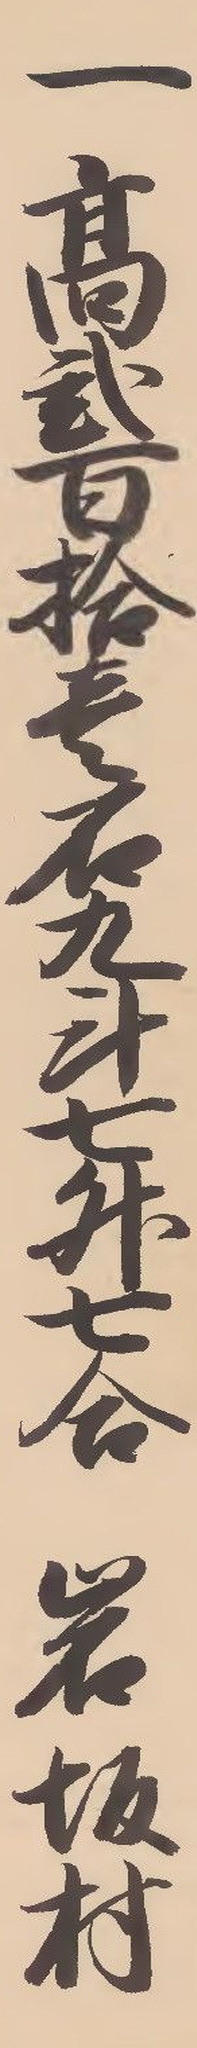一高弐百拾壱石九斗七升七合岩坂村
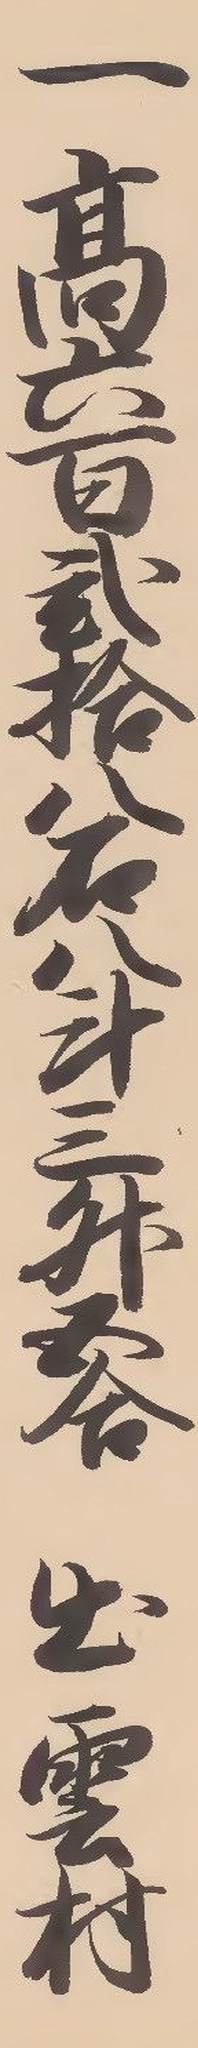一高六百弐拾八石八斗三升五合出雲村
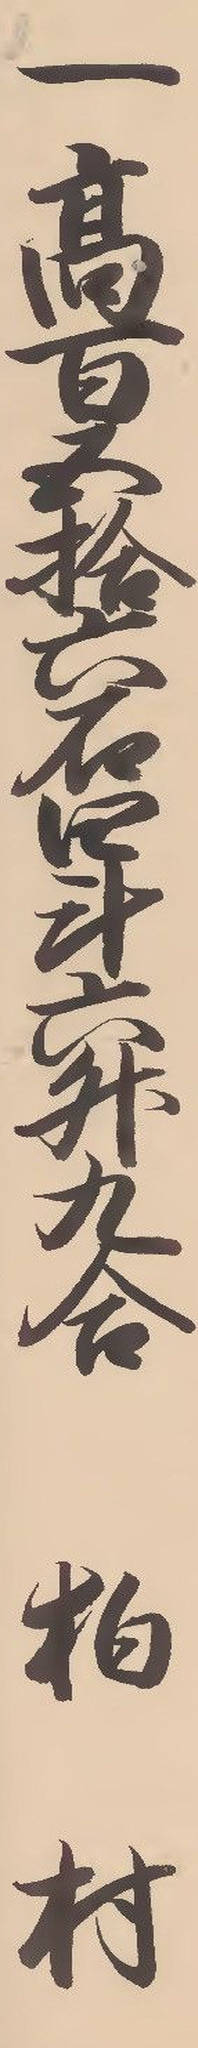一高百五拾六石四斗六升九合柏村
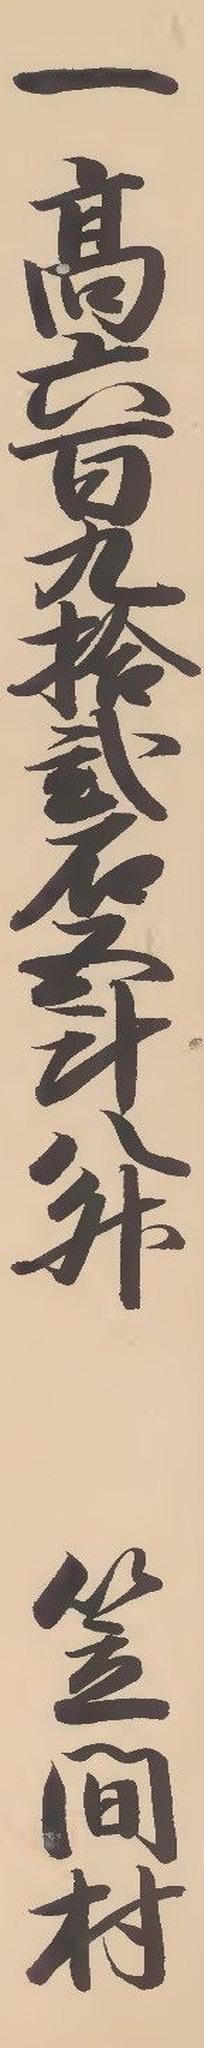一高六百九拾弐石五斗八升笠間村
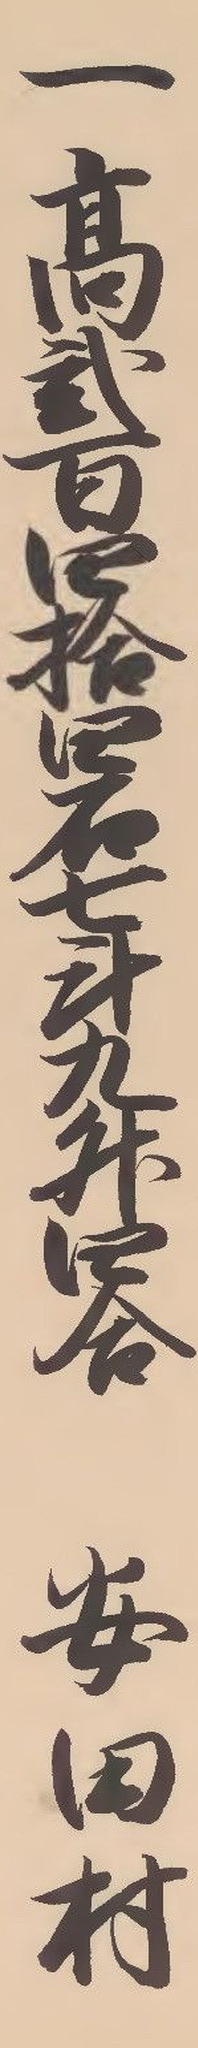一高弐百四拾四石七斗九升四合安田村
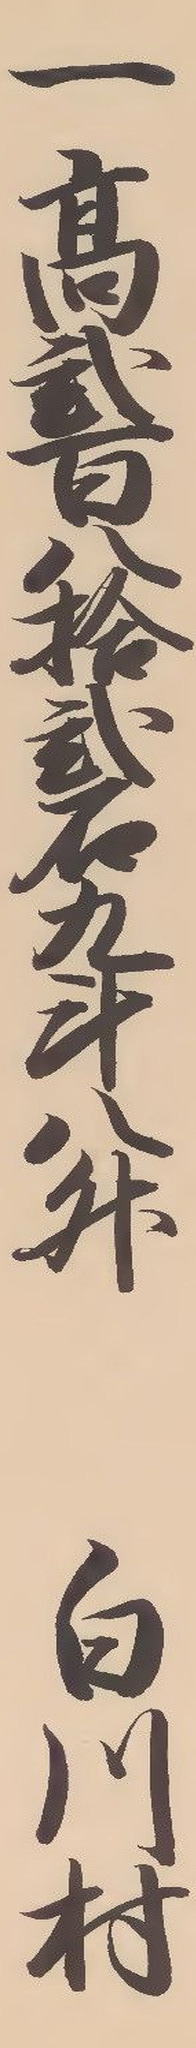一高弐百八拾弐石九斗八升白川村
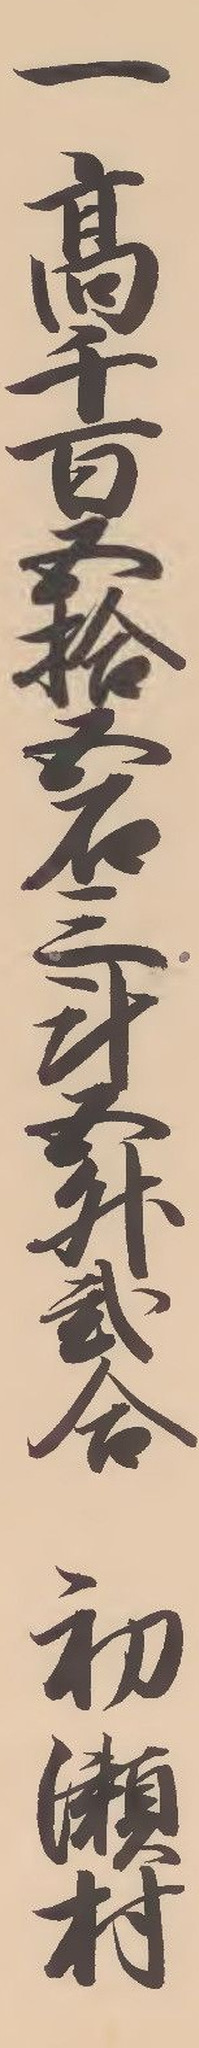一高千百五拾五石三斗五升弐合初瀬村

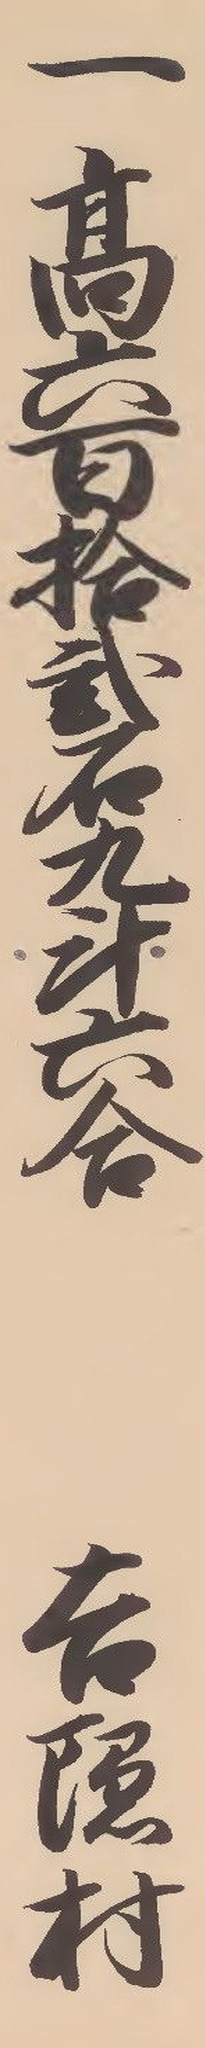一高六百拾弐石九斗六合吉隠村
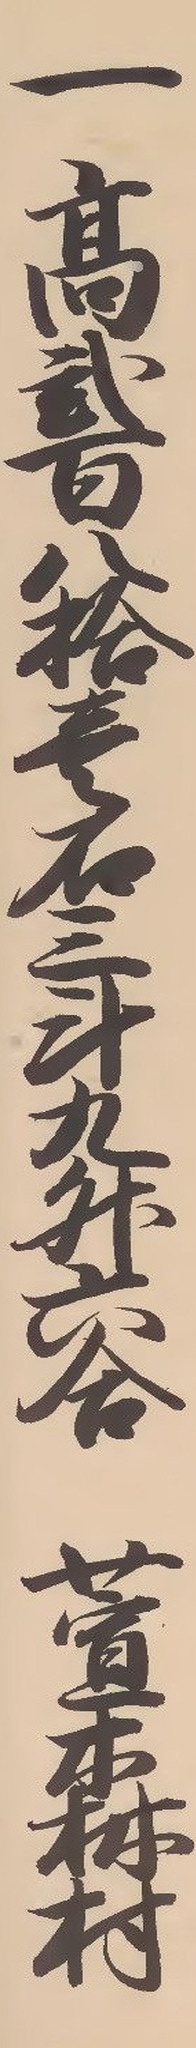一高弐百八拾壱石三斗九升六合萱森村
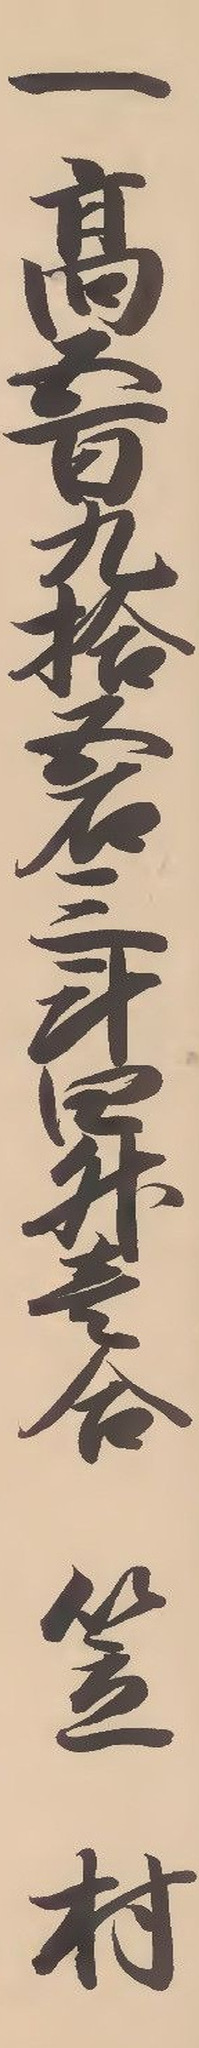一高五百九拾五名三斗四升壱合笠村
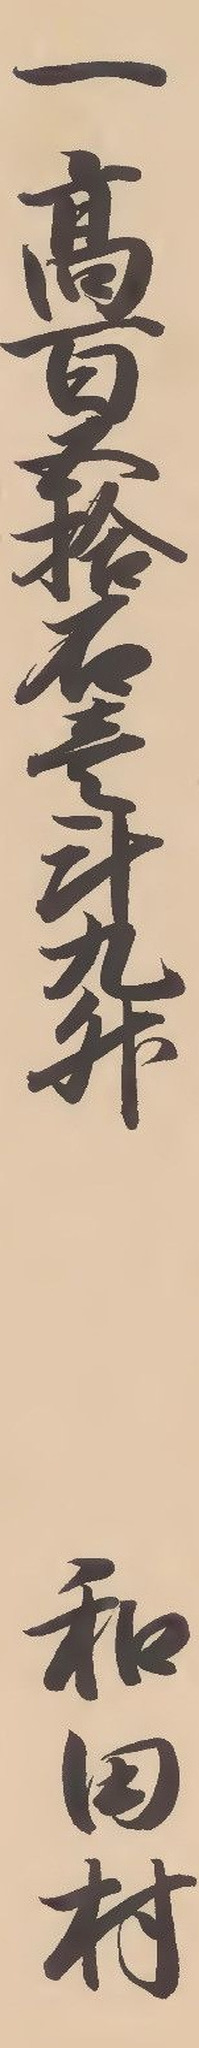一高百五拾石壱斗九升和田村
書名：大和国郷帳
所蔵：国立公文書館 National Archives of Japan
